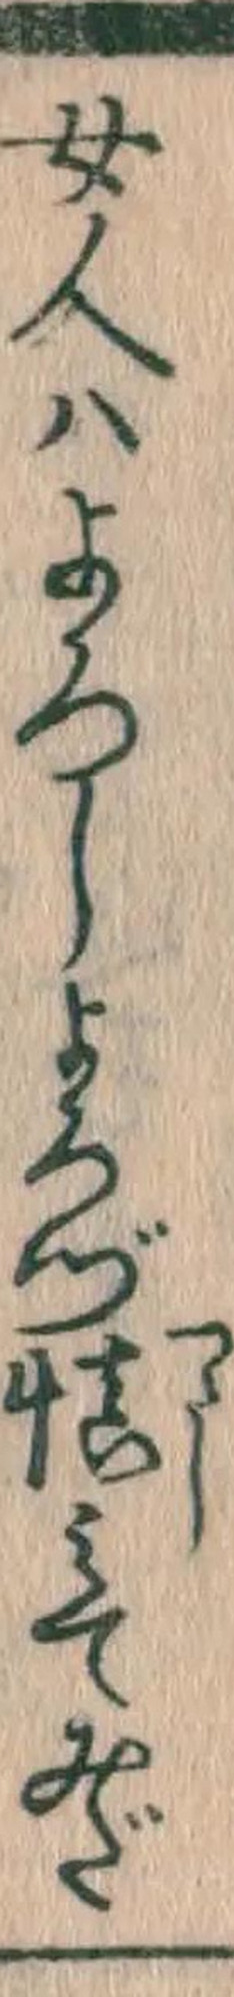女人はよろしよろづ慎みてみだ
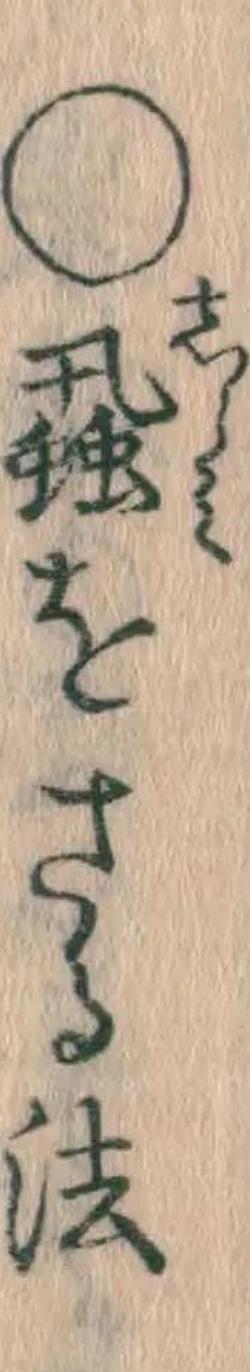○蝨をさる法
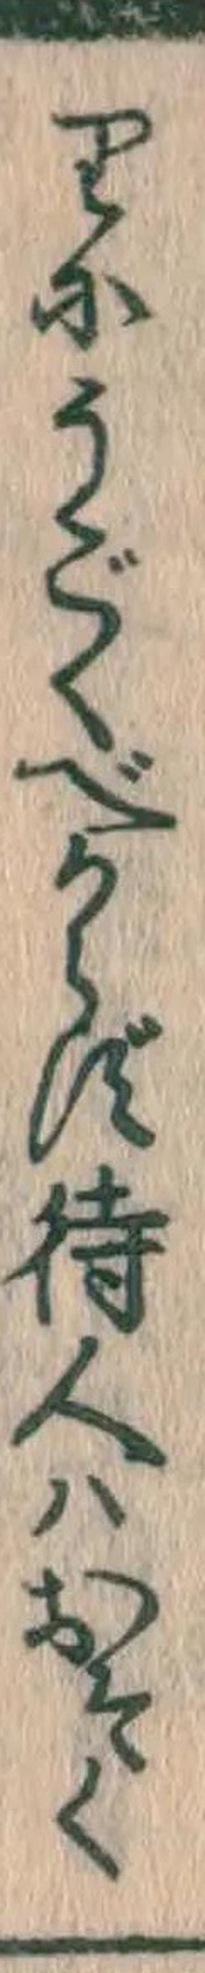りにうごくべからず待人はおそく
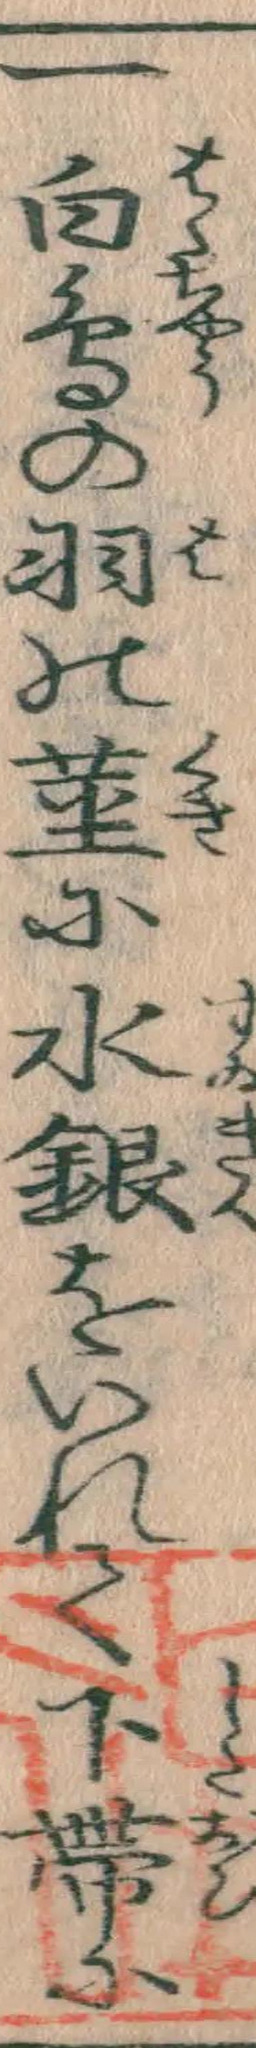一白鳥の羽の茎に水銀をいれて下帯に
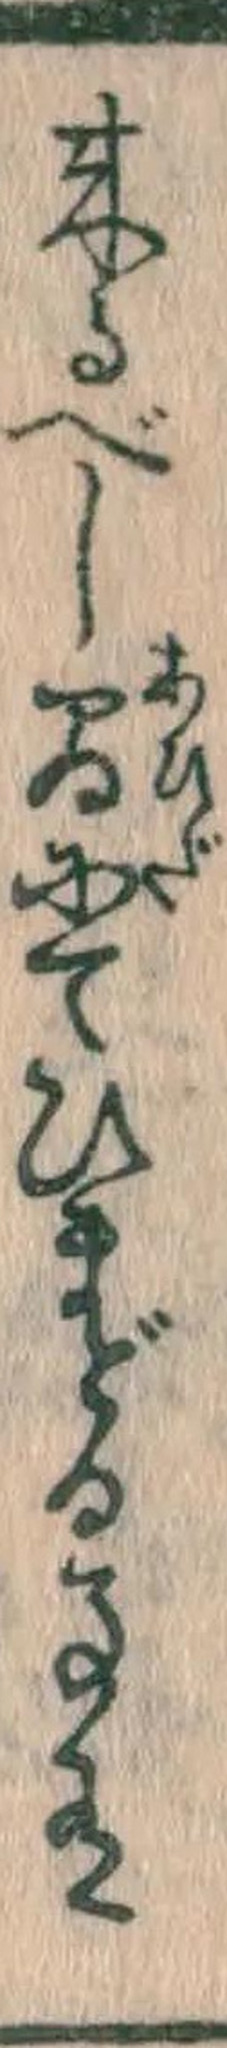来るべし間にてひまどる事有
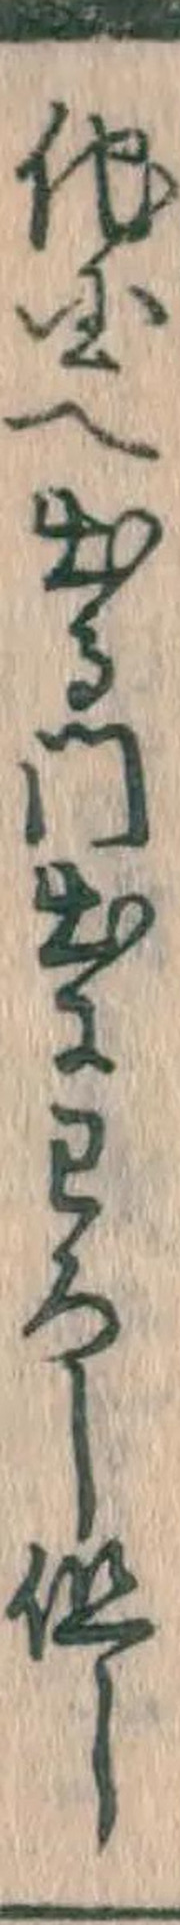他国へ出る門出にわろし但し
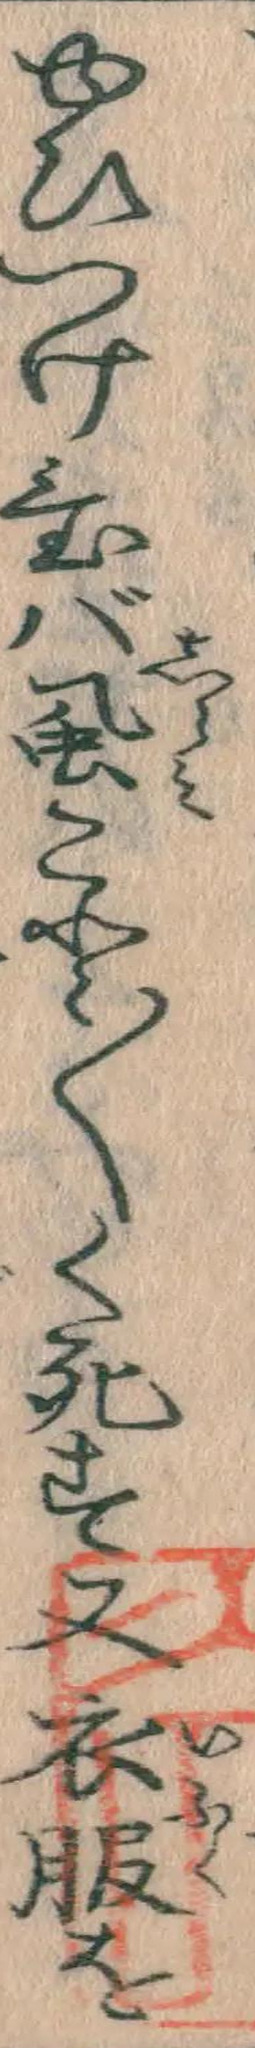ゆひつけ置ば蝨こと〳〵く死す又衣服を
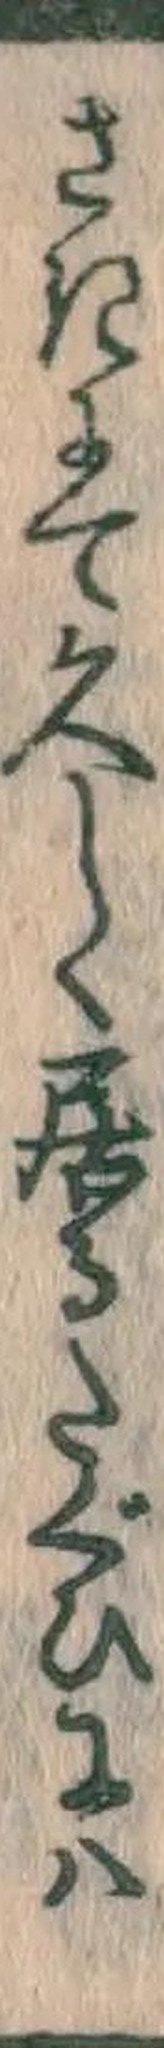さきにて久しく居るたぐひには
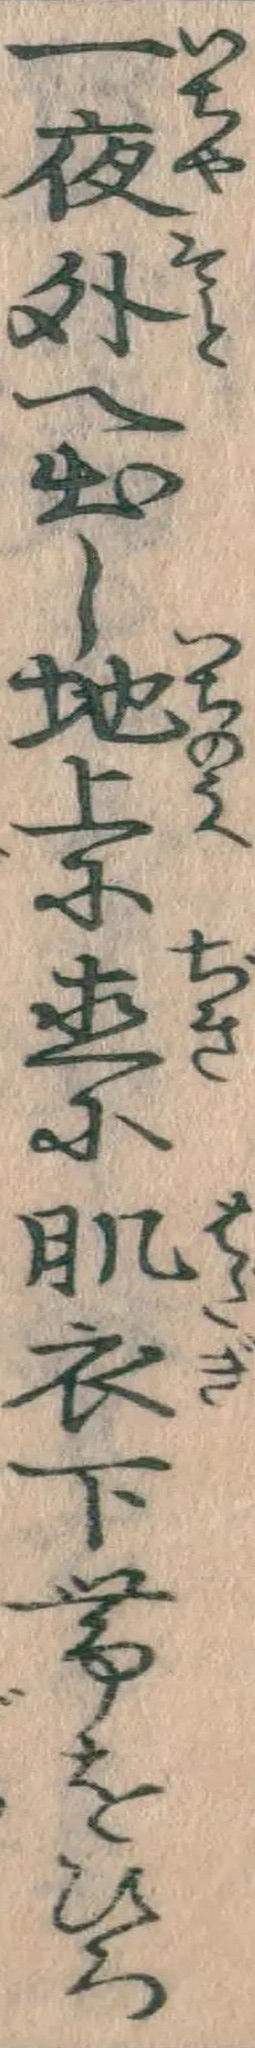一夜外へ出し地上に直に肌着下帯をひろ
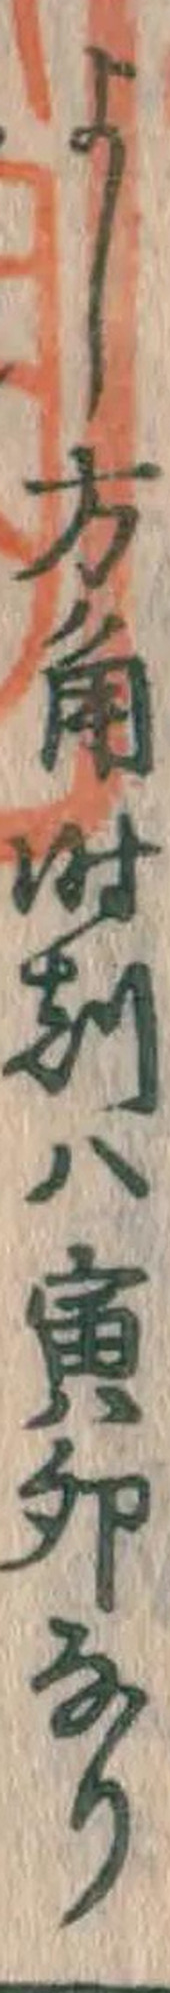よし方角時刻は寅卯なり
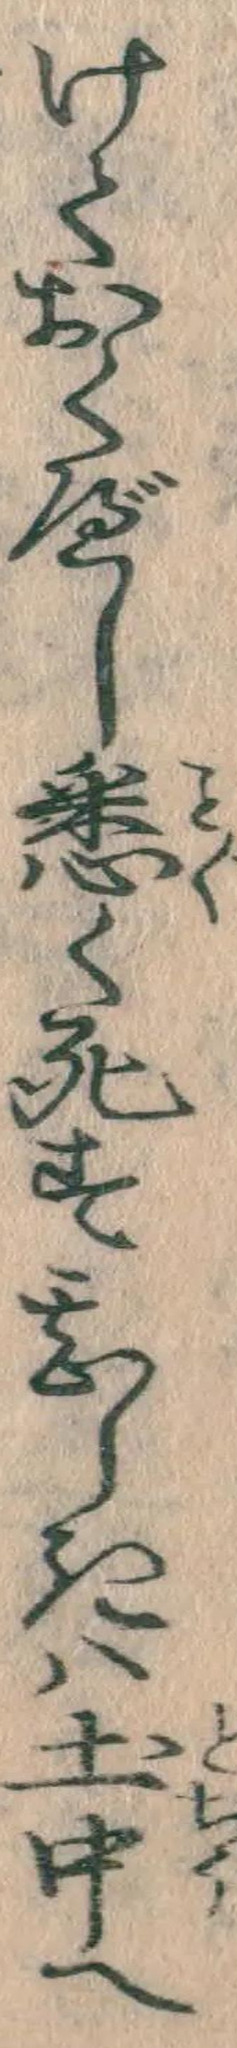けておくべし悉く死す甚しきは土中へ
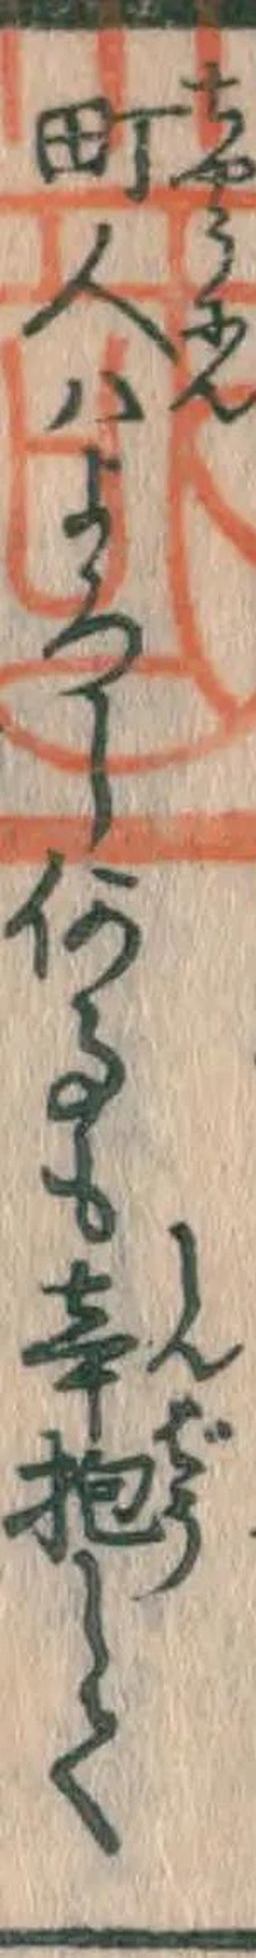町人はよろし何事も辛抱して
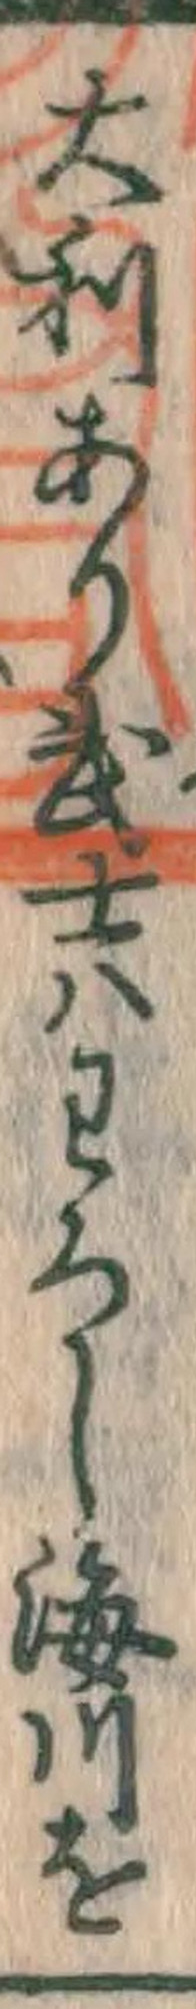大利あり武士はわろし海川を
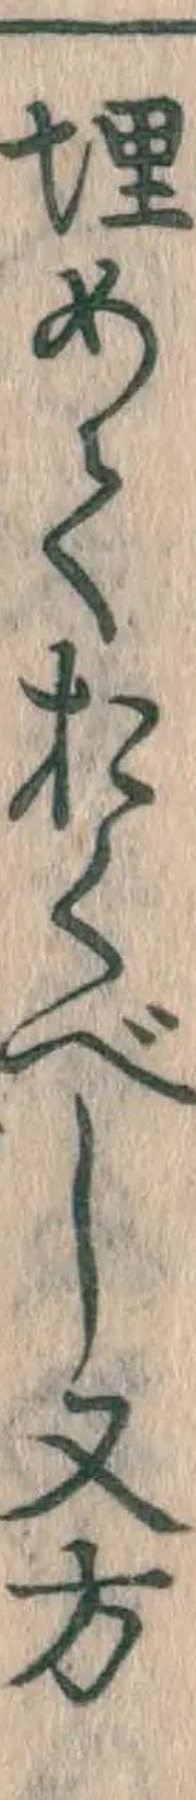埋めておくべし又方
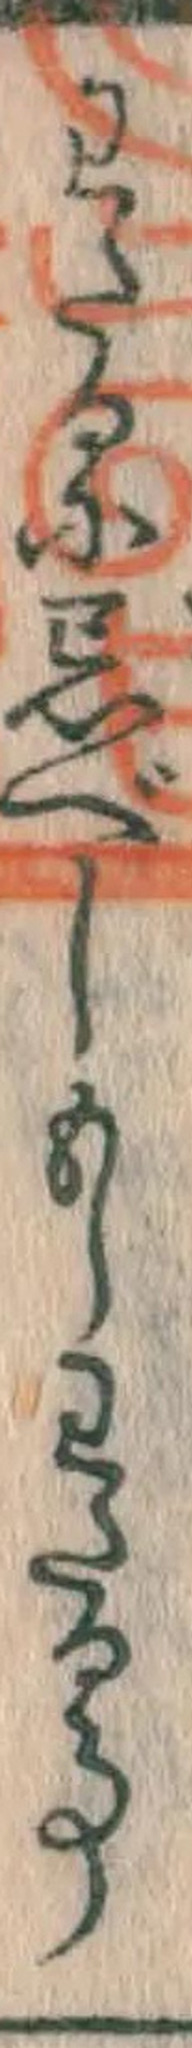わたるに忌べしもしわたる事
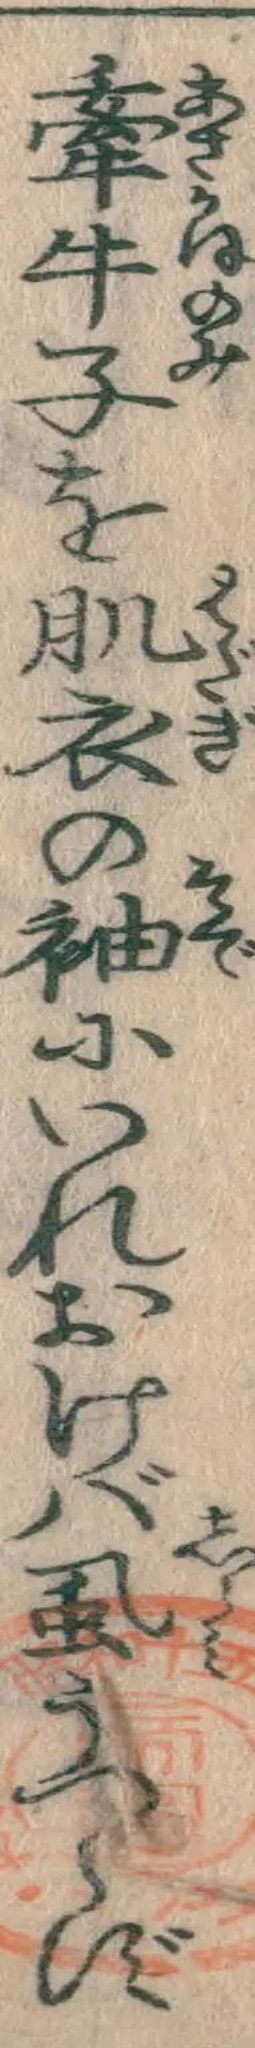牽牛子を肌着の袖にいれおけば蝨うつらず
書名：広益秘事大全 3巻. [2]
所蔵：国立国会図書館 National Diet Library, JAPAN
